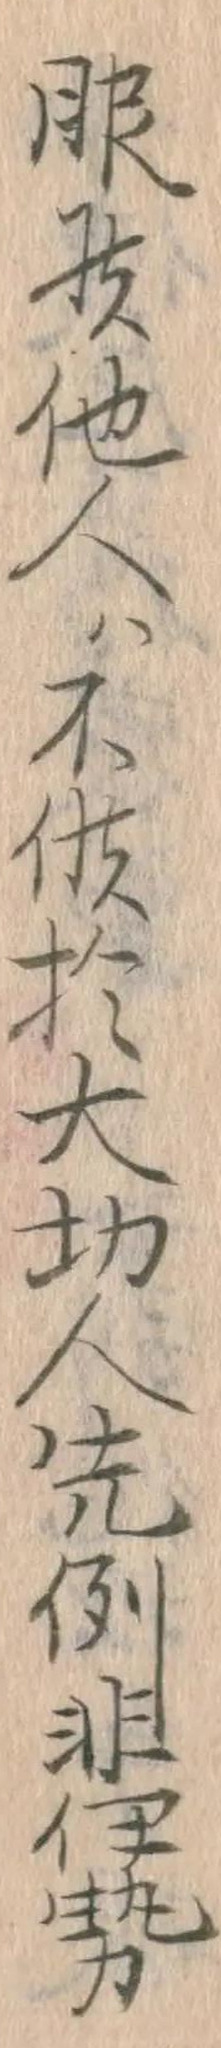服候他人ハ不候大功人先例非伊勢
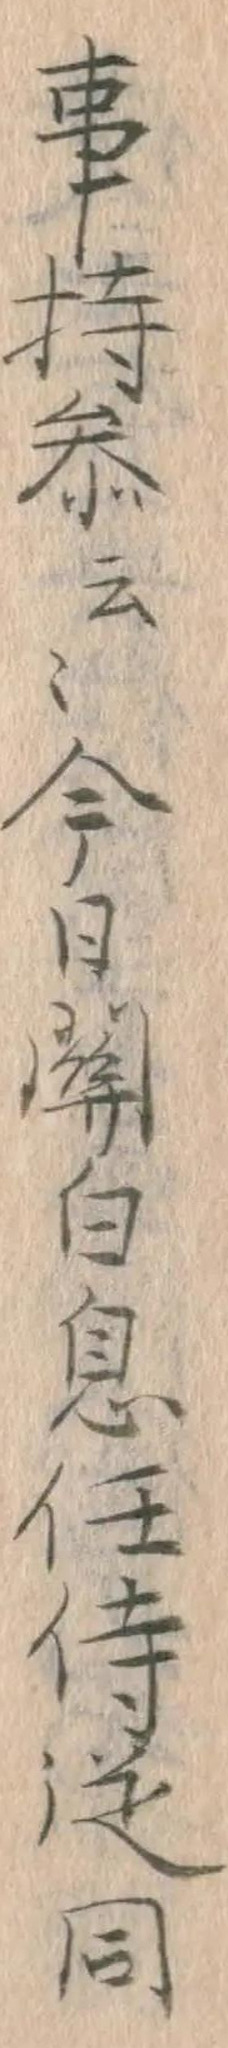事持参云々今日関白息任侍従同
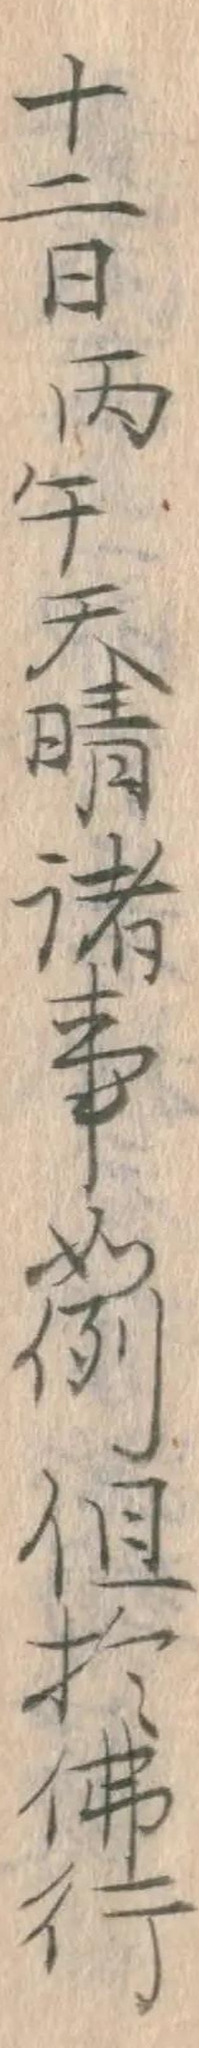十二日丙午天晴諸事如例但於仏行
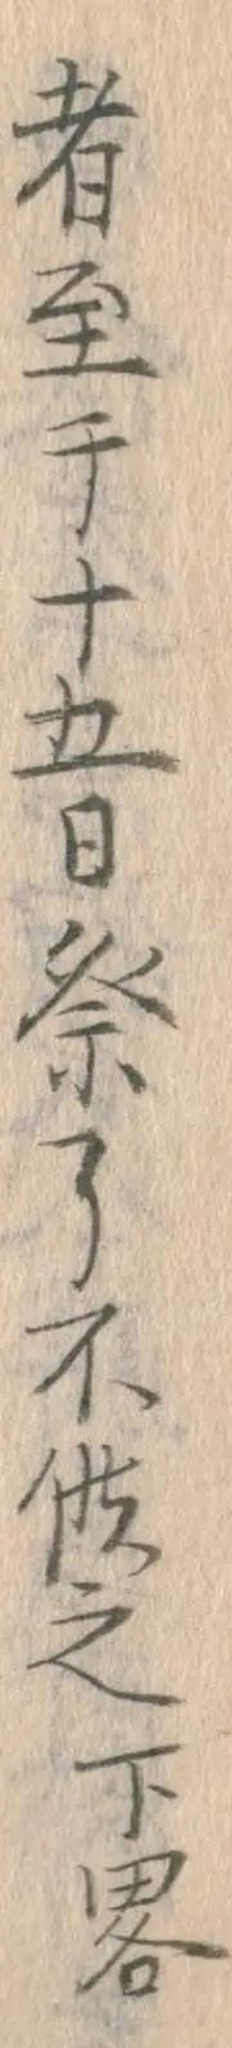者至于十五日祭了不候之下略
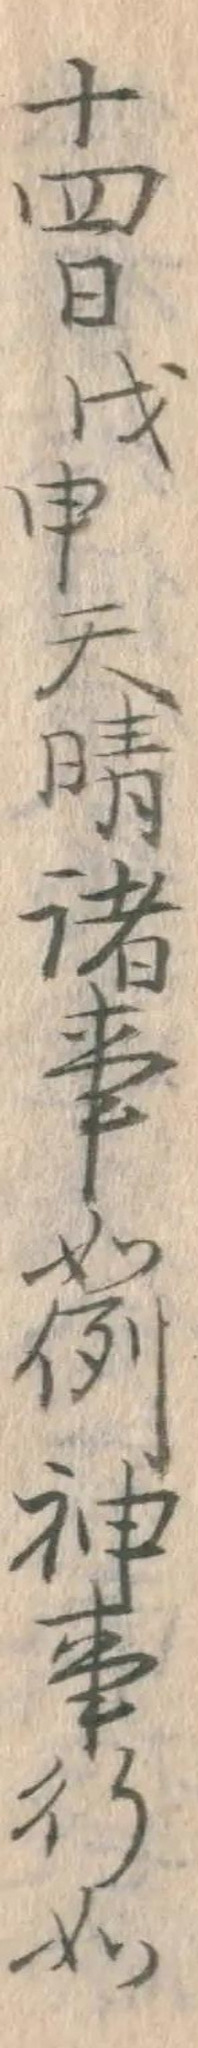十四日戊申天晴諸事如例神事行如
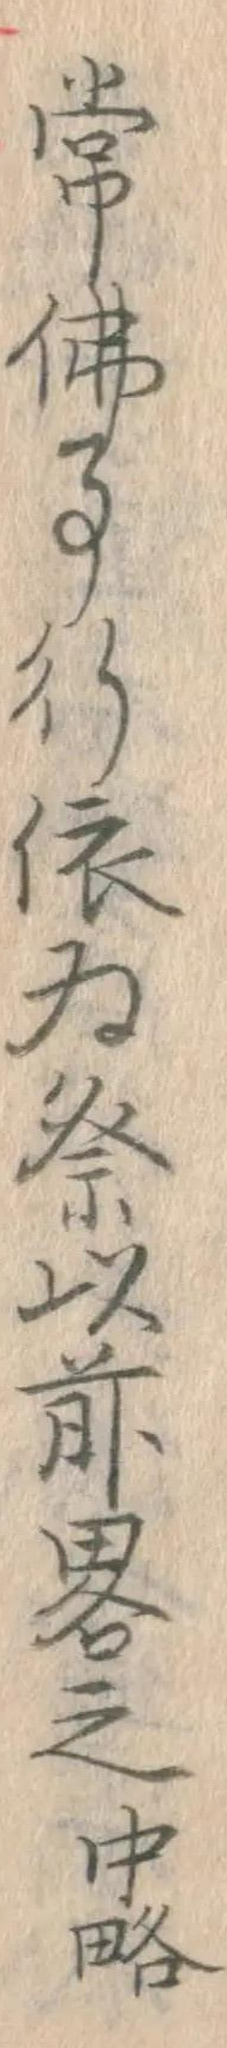常仏事行依為祭以前略之中略
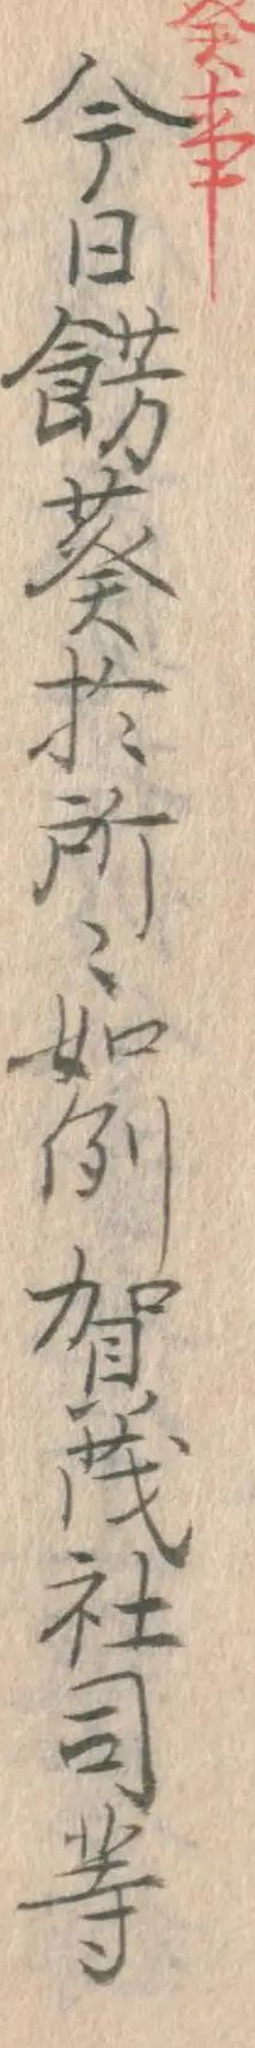今日飾葵於所々如例賀茂社司等
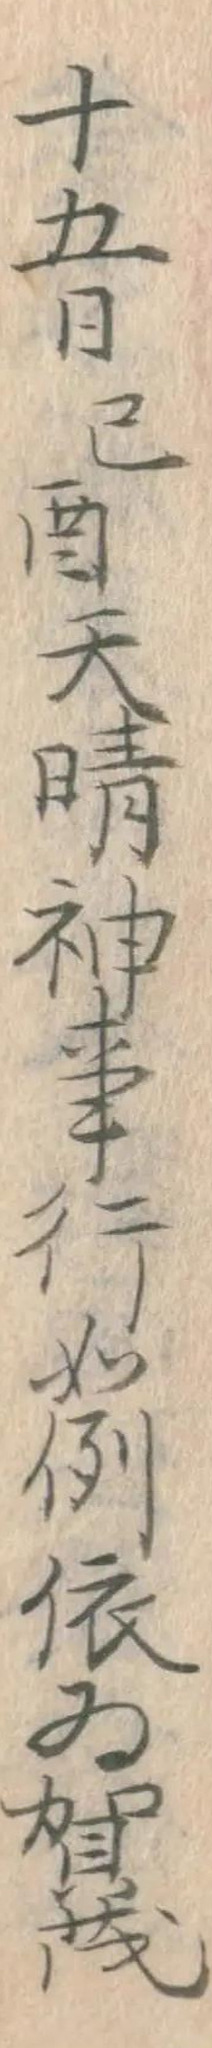十五日己酉天晴神事行如例依為賀茂
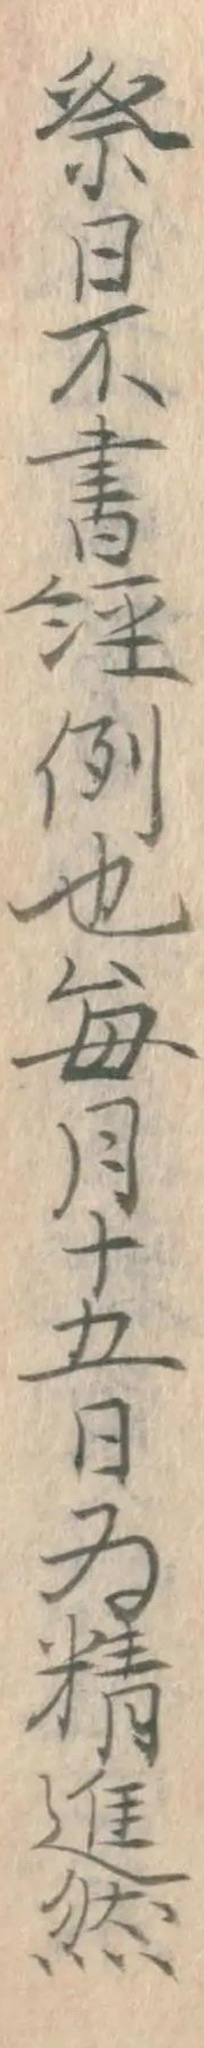祭日不書経例也毎月十五日為精進然

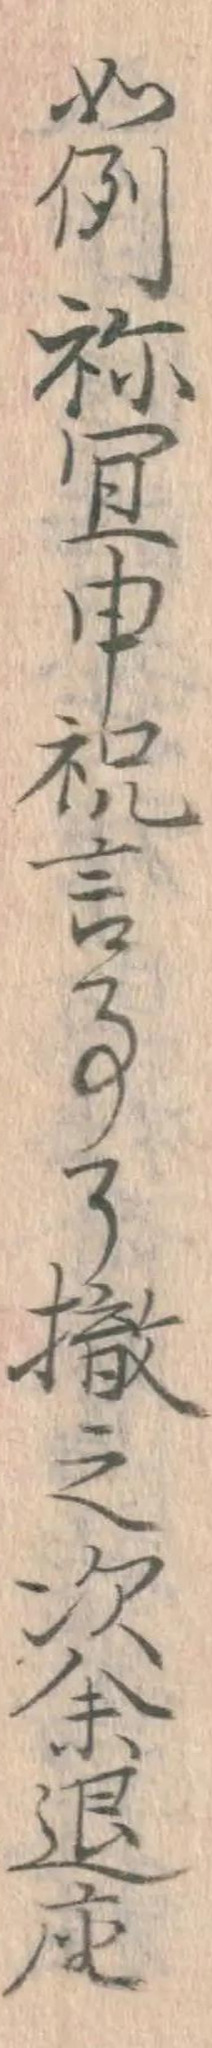如例称宜申祝言事了撤之次余退座
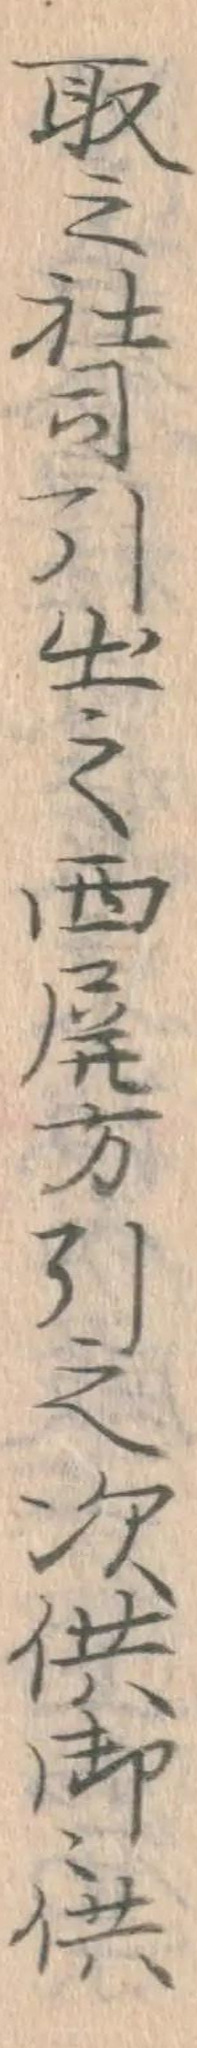取之社司引出之西屏方引之次供御々供
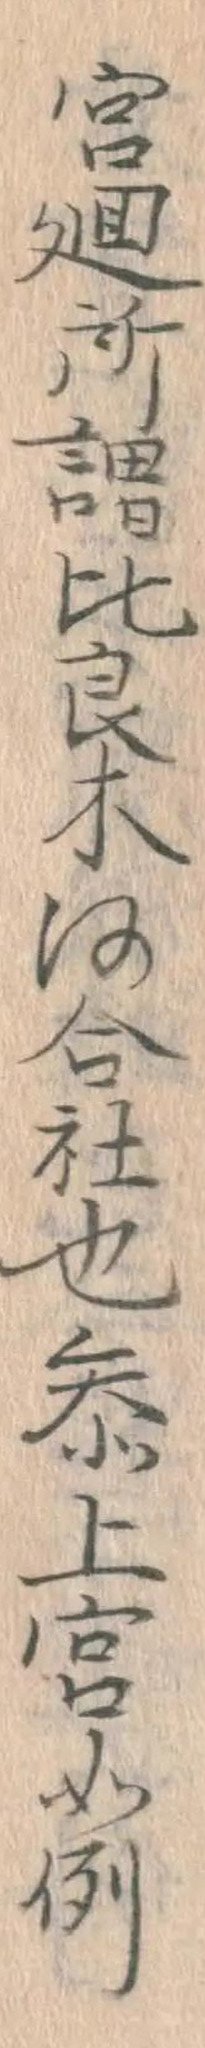宮廻所謂比良木河合社也参上宮如例
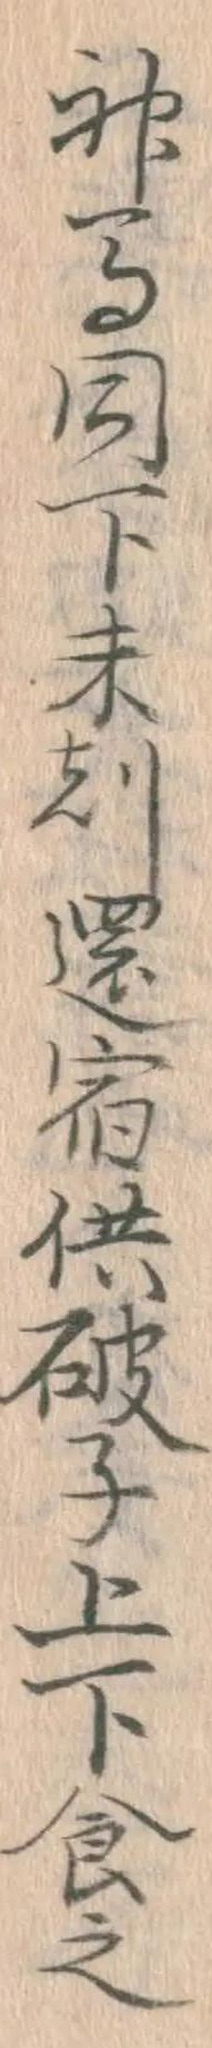神馬同下未刻還宿供破子上下食之
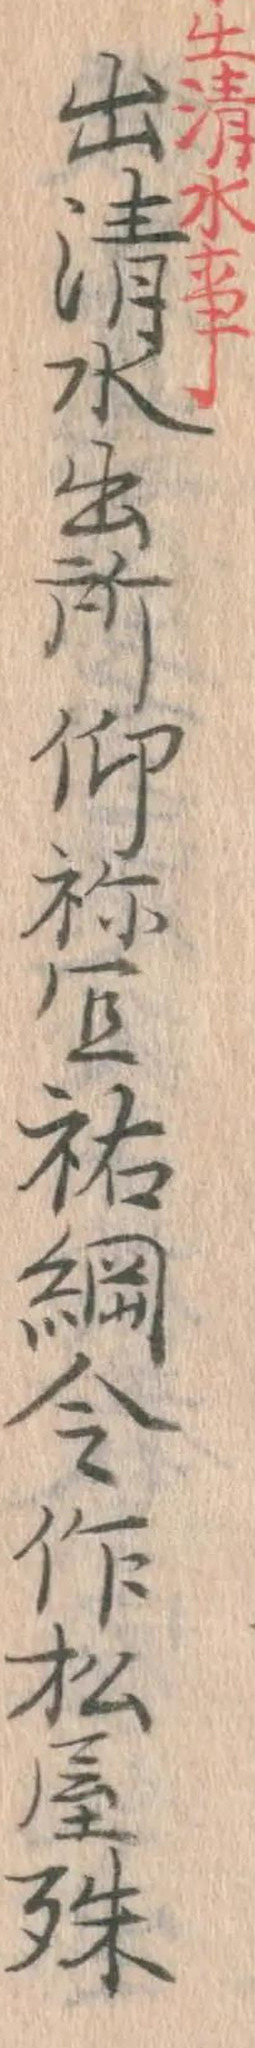出清水出所仰祢宜祐綱令作松屋殊
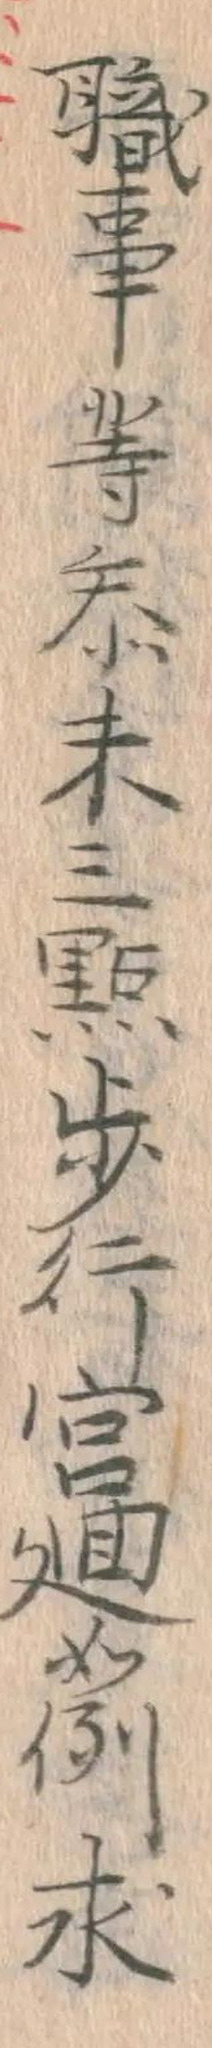職事等参未三点歩行宮廻如例求
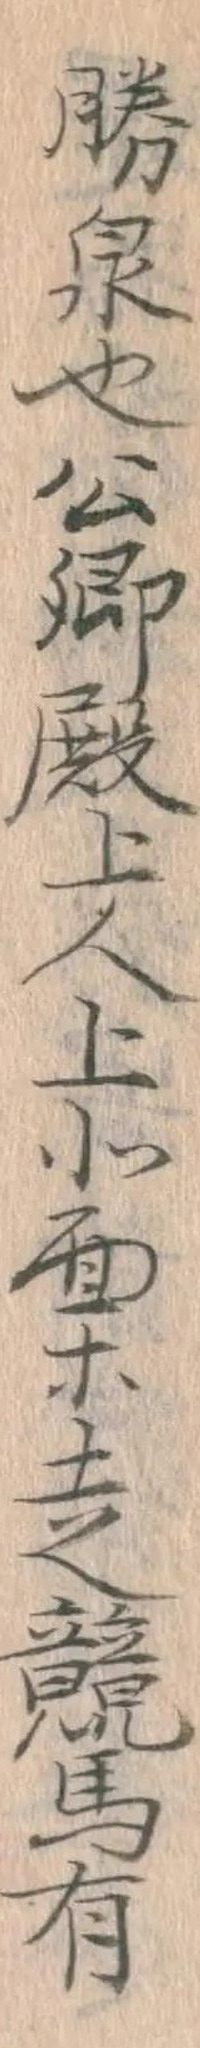勝泉也公卿殿上人上北面等走競馬有
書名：賀茂社記録. 第80冊
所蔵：国立国会図書館 National Diet Library, JAPAN
